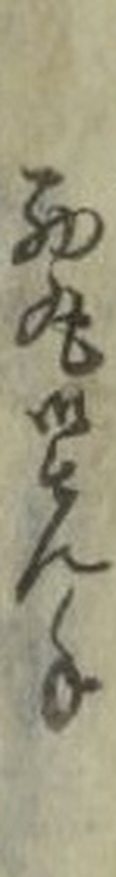西丸御先手
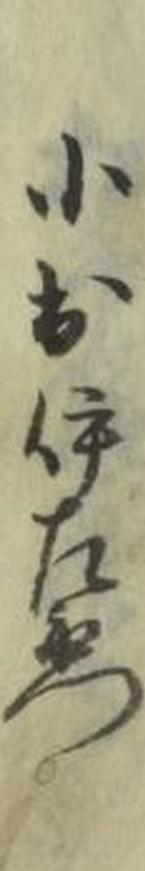小出伊左衛門
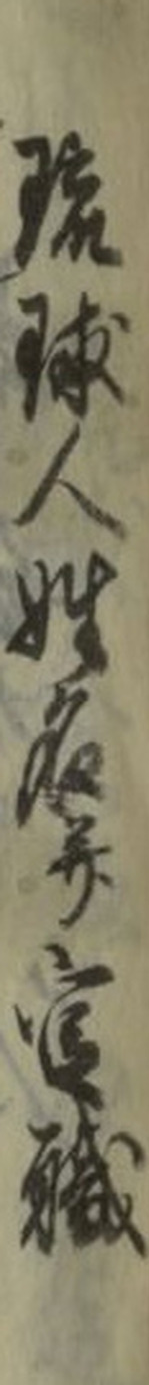琉球人姓名并官職
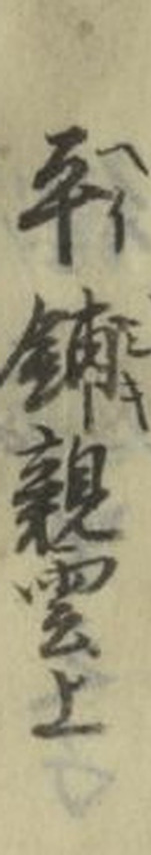楽正平鋪親雲上
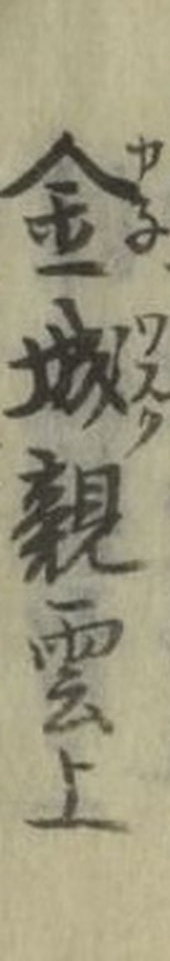使賛金城親雲上
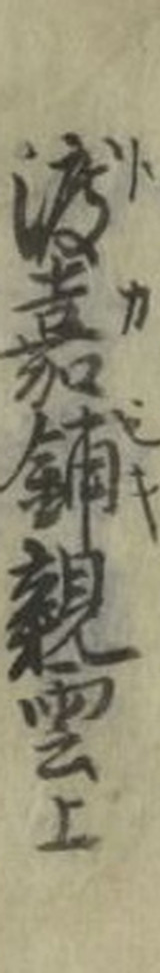渡嘉鋪親雲上
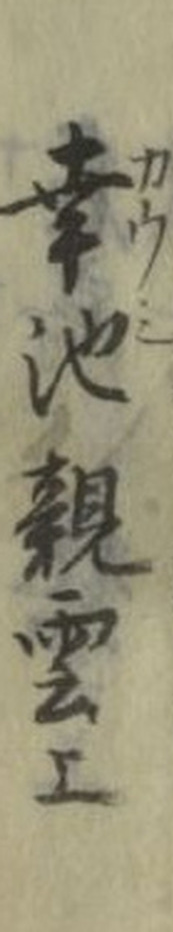幸池親雲上

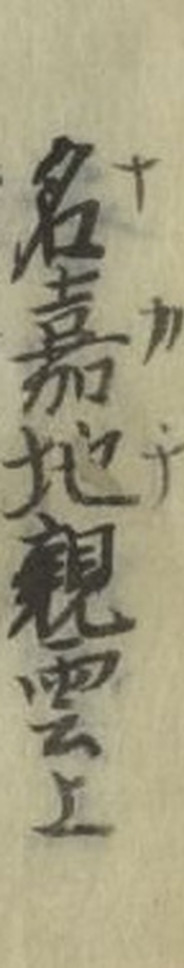名嘉地親雲上
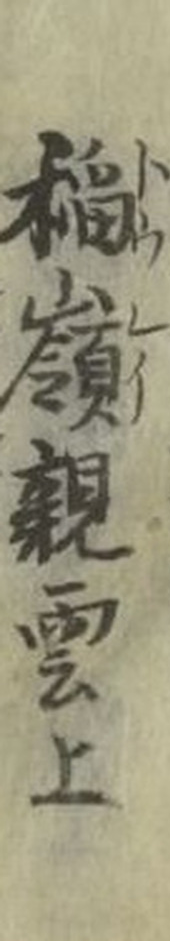稲嶺親雲上）
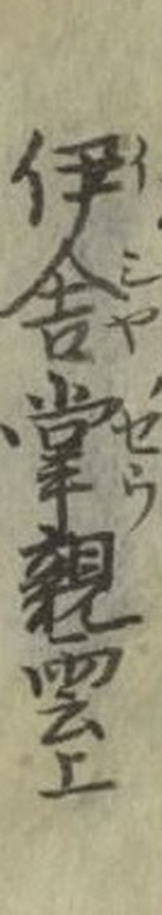伊舎掌親雲上
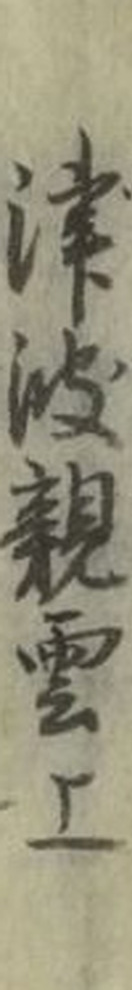津波親雲上
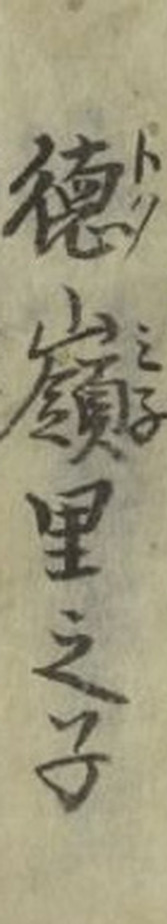徳嶺里之子
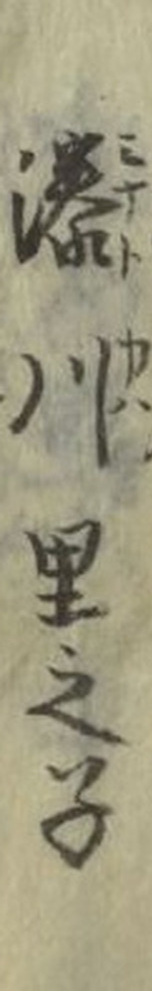湊川里之子
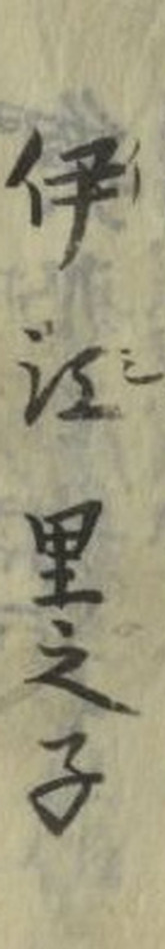伊使里之子
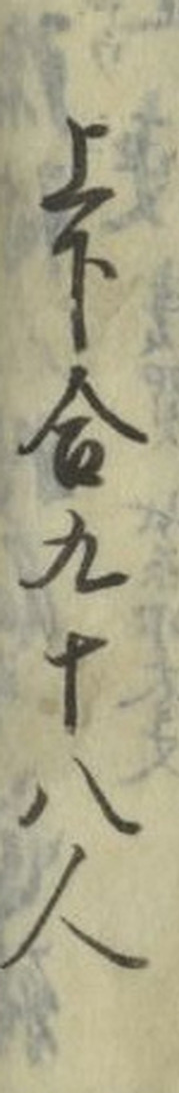上下合九十八人
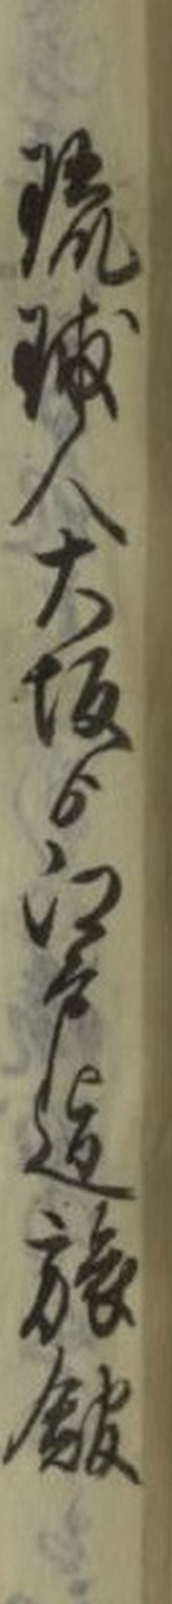琉球人大坂ゟ江戸迠旅館
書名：琉球人来朝之記
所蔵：University of the Ryukyus Library
